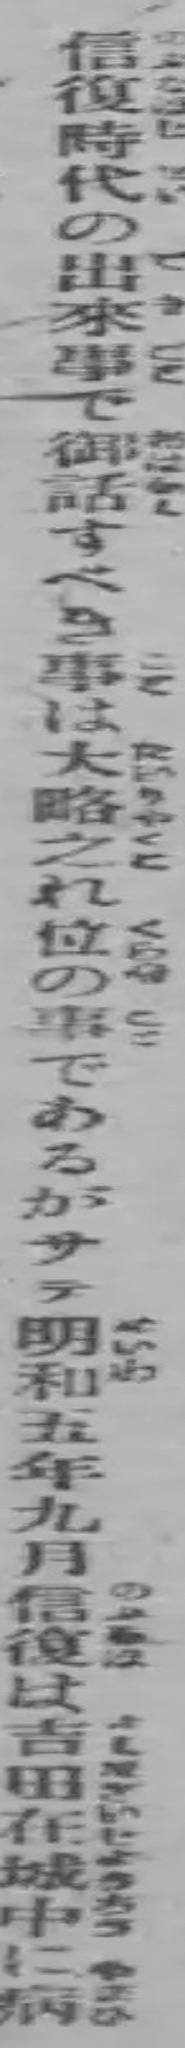信復時代の出来事で御話すべき事は大略之れ位の事であるがサテ明和五年九月信復は吉田在城中に病
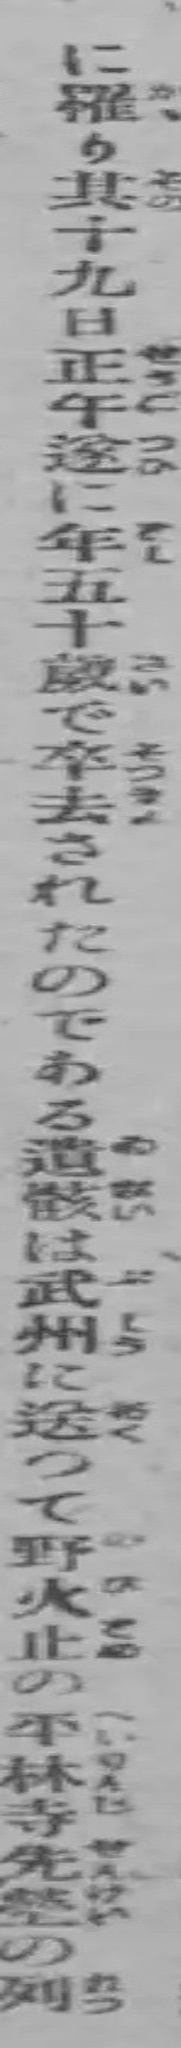に罹り其十九日正午遂に年五十歳で卒去されたのである遺骸は武州に送つて野火止の平林寺先塋の列
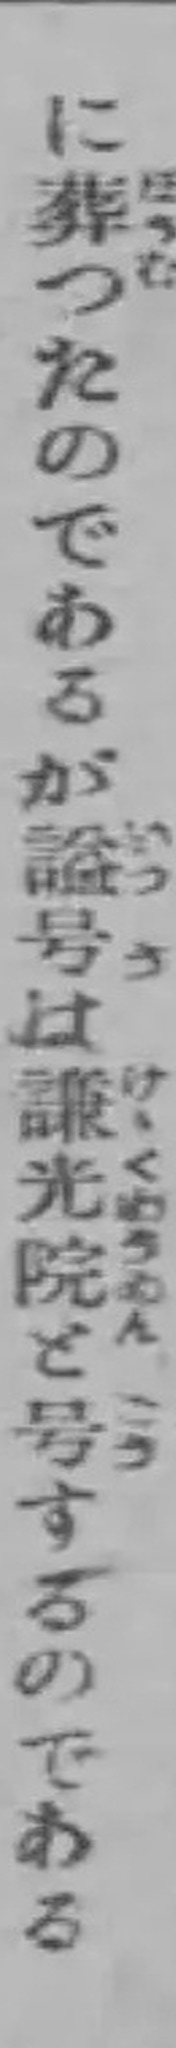謙光院に葬つたのであるが謚号が謙光院と号するのである
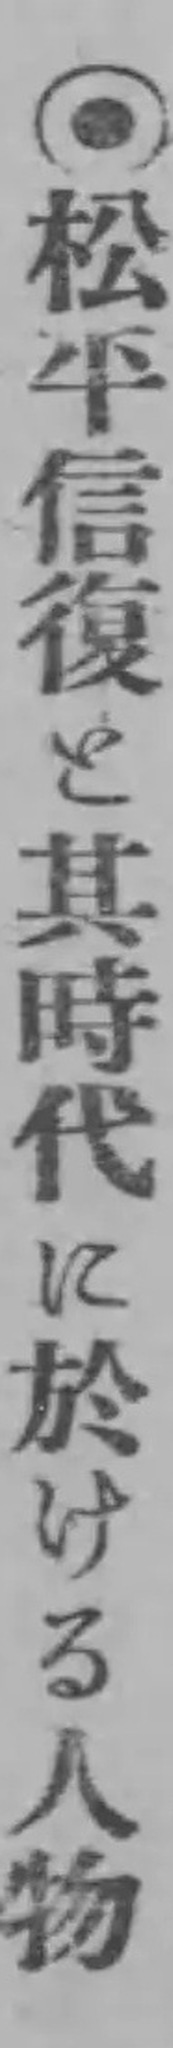⦿松平信復と其時代に於ける人物
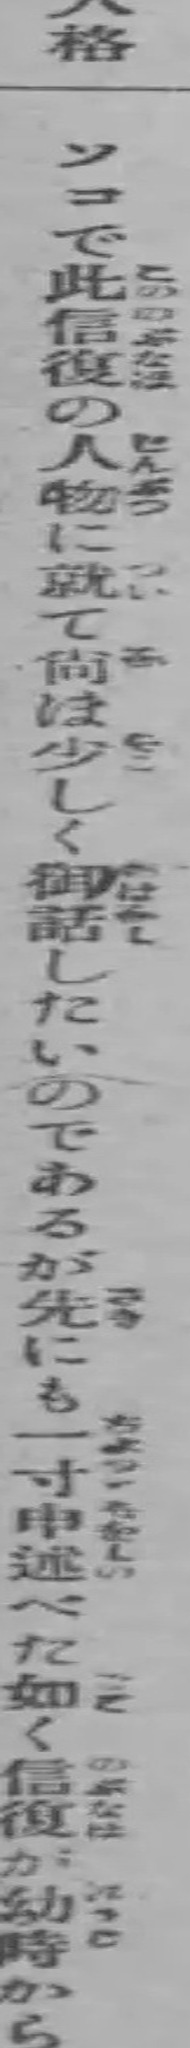信復の人格ソコで此信復の人物に就て尚ほ少しく御話したいのであるが先にも一寸申述べた如く信復が幼時から

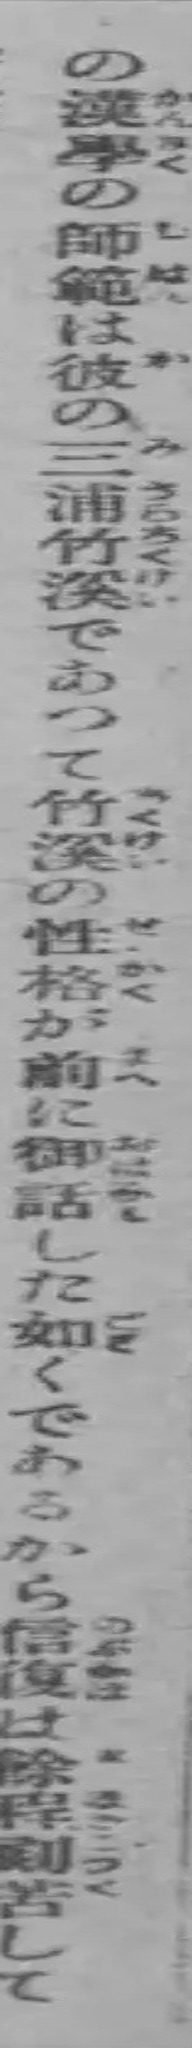の漢学の師範は彼の三浦竹渓であつて竹渓の性格が前に御話した如くであるから信復は余程刻苦して
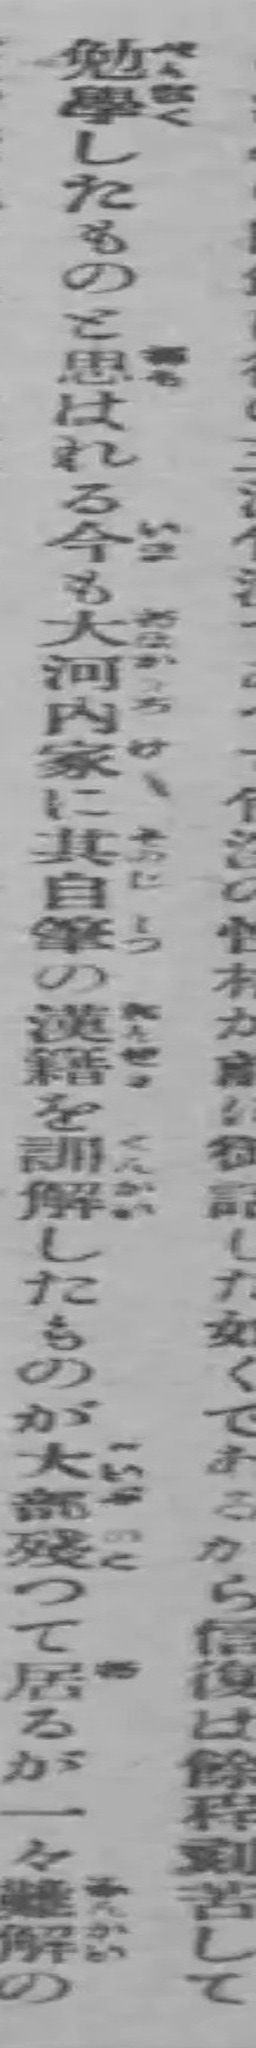勉学したものと思はれる今も大河内家に其自筆の漢籍を訓解したものが大部残つて居るが一々難解の
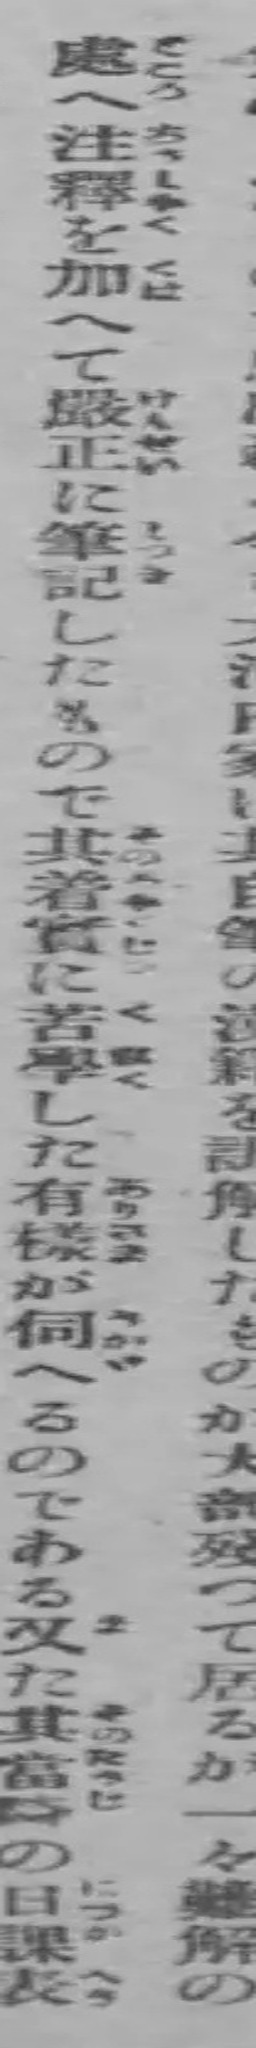処へ注釈を加へて厳正に筆記したもので其着実に苦学した有様が伺へるのである又た其当時の日課表
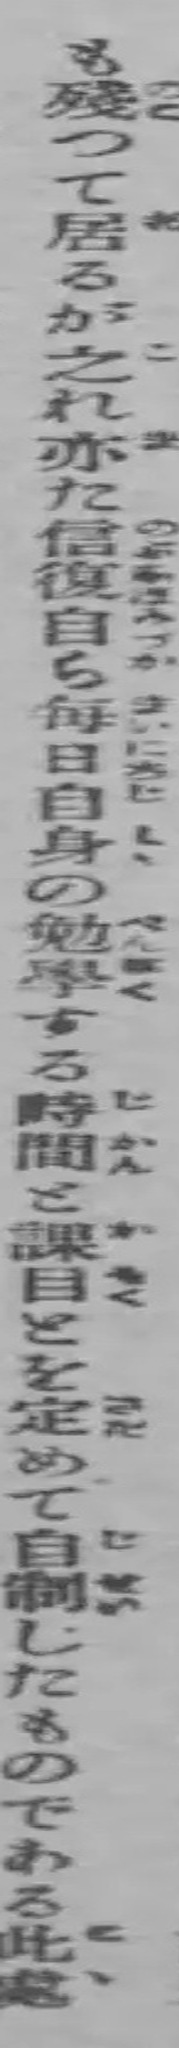も残つて居るが之れ亦た信復自ら毎日自身の勉学する時間と課目とを定めて自制したものである此処
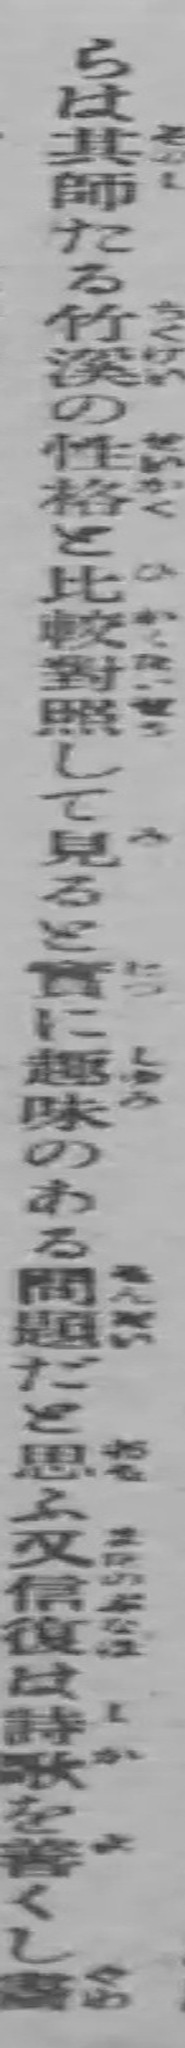らは其師たる竹渓の性格と比較対照して見ると実に趣味のある問題だと思ふ又信復は詩歌を善くし画
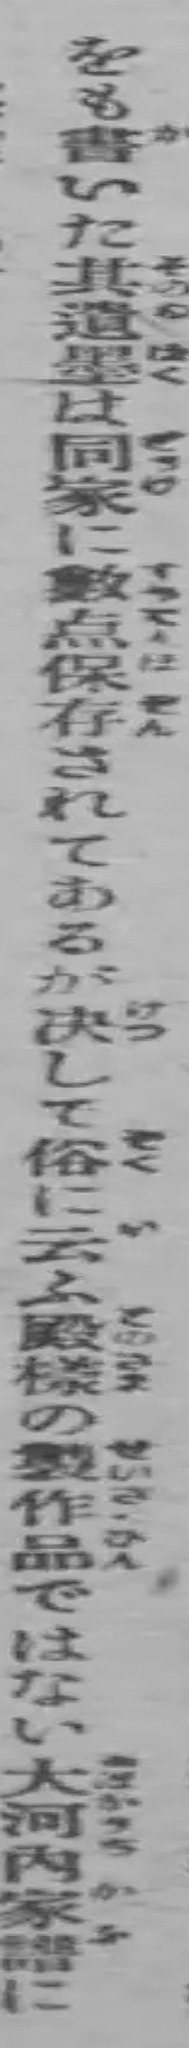をも書いた其遺墨は同家に数点保存されてあるが決して俗に云ふ殿様の製作品ではない大河内家譜に
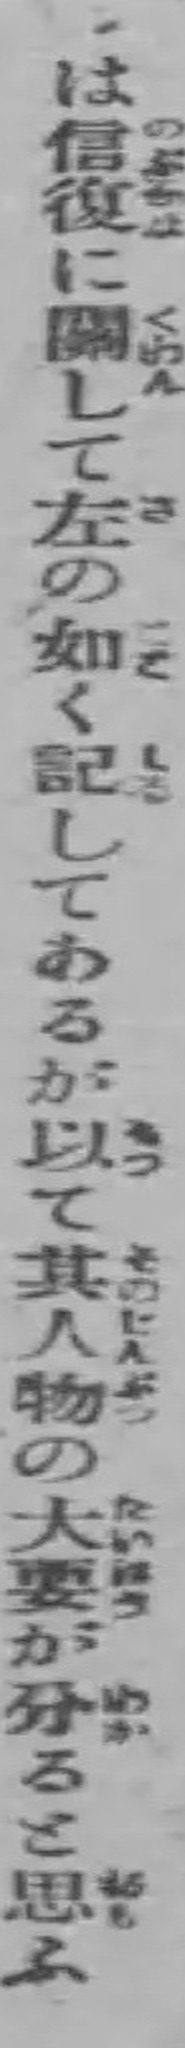は信復に関して左の如く記してあるが以て其人物の大要が分ると思ふ
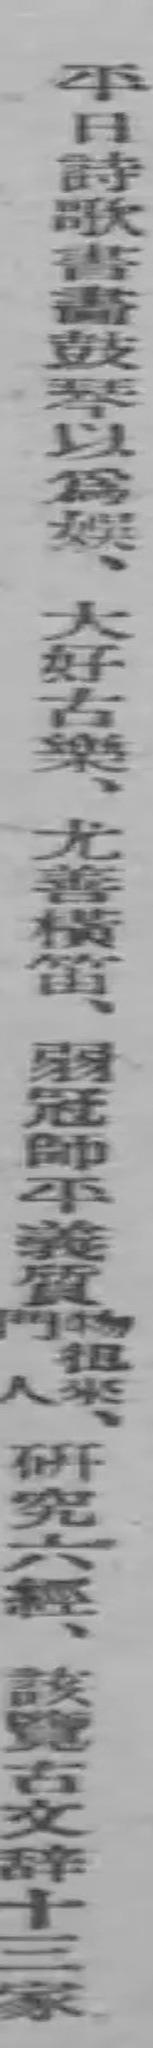平日詩歌書画鼓琴以為娯、大好古楽、尤善横笛、弱冠師平義質物徂徠門人、研究六経、該覧古文辞十三家
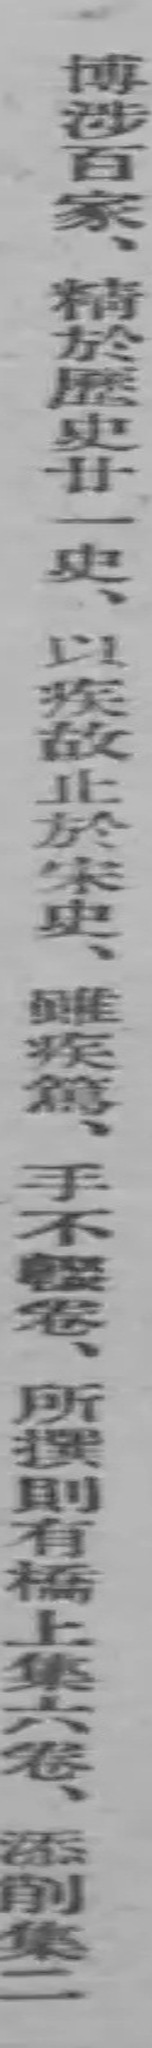博渉百家、精於歴史廿一史、以疾故止於宋史、雖疾篤、手不軽巻、所撰則有橋上集六巻、添削集二
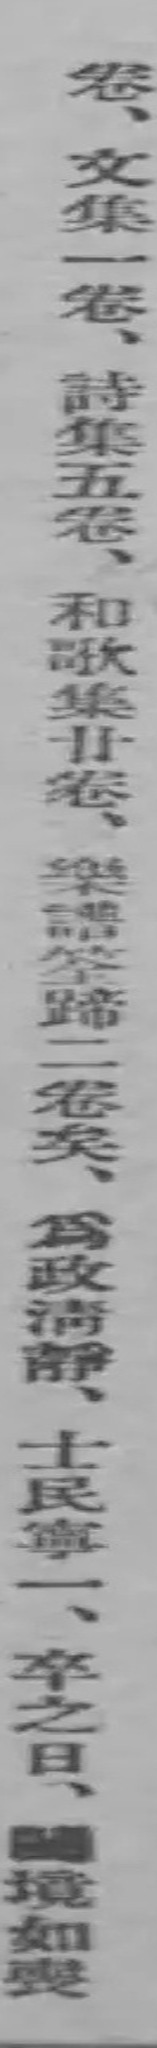巻、文集一巻、詩集五巻、和歌集廿巻、楽譜筌蹄二巻矣、為政清静、士民寧一、卒之日、関境如喪
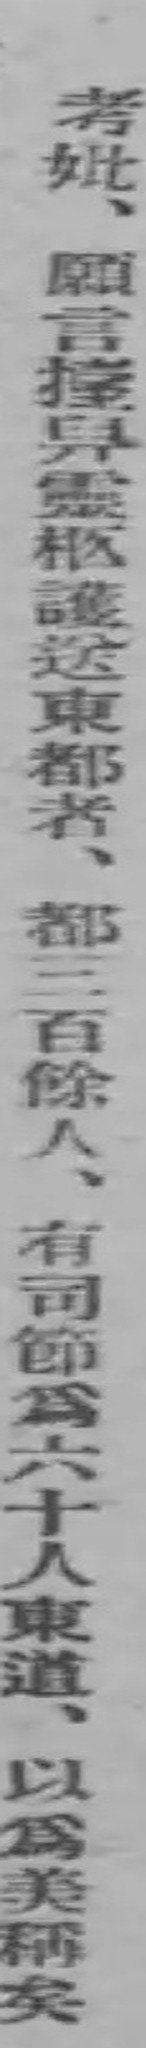考妣、願言擡昇霊柩護送東都者、都三百余人、有司節為六十人東道、以為美称矣
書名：豊橋市史談
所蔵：国立国会図書館 National Diet Library, JAPAN
